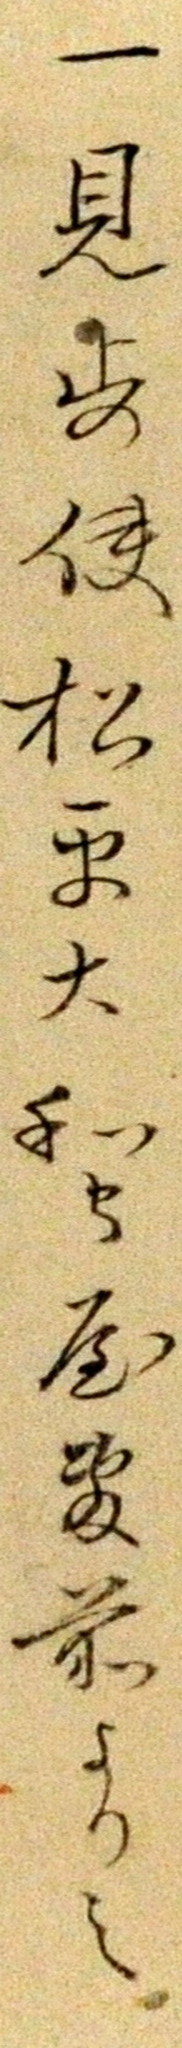一見歩使松平大和守屋敷前より之
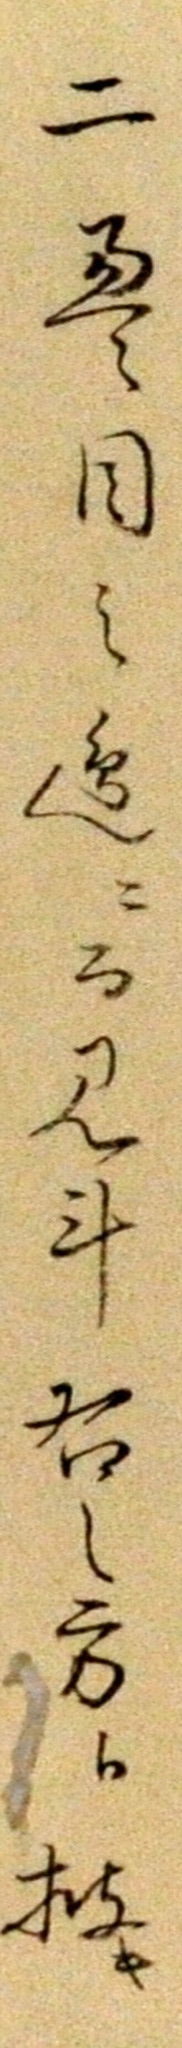二畳目之辺ニ而見計右之方え披キ
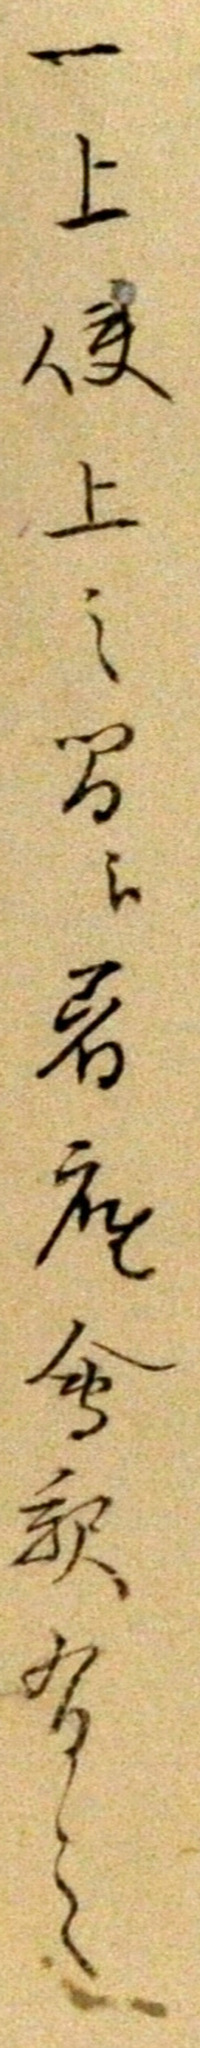一上使上之間え着座会釈有之
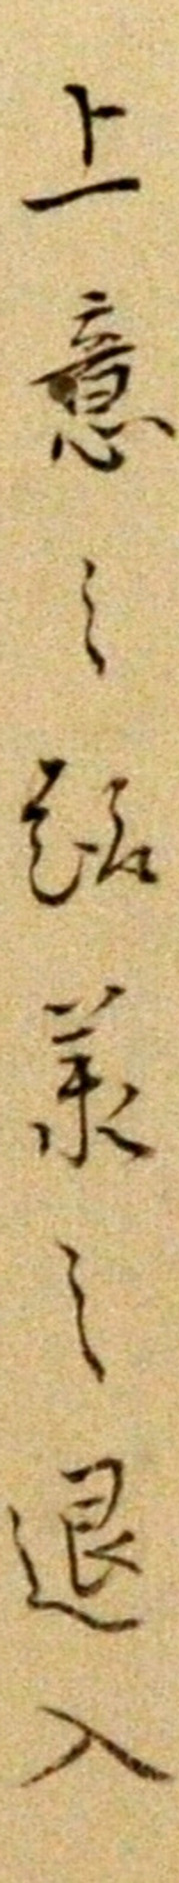上意之趣承之退入

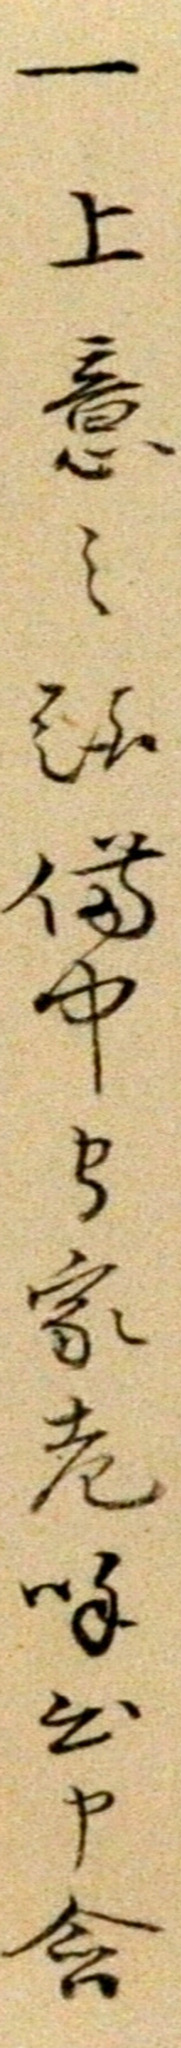一上意之趣備中守家老呼出申含
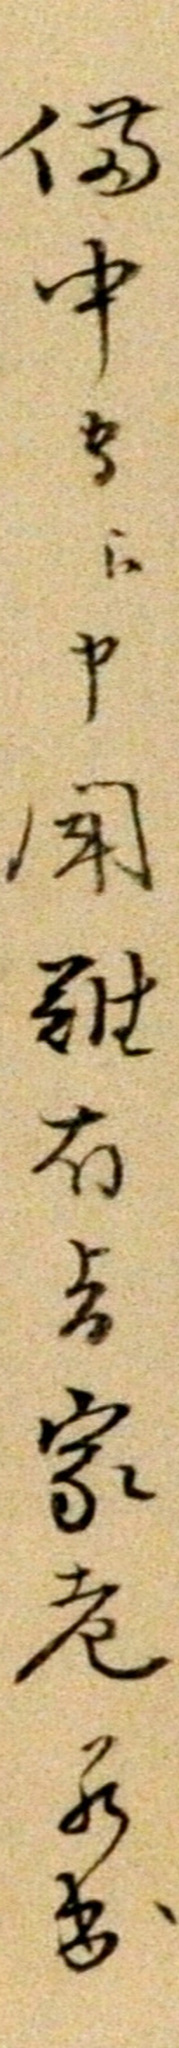備中守え申聞難有旨家老罷出
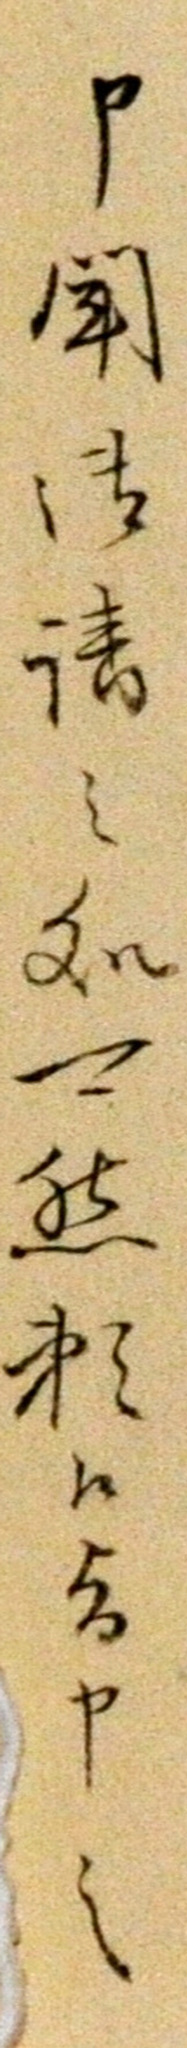申聞御請之処可然頼候旨申之
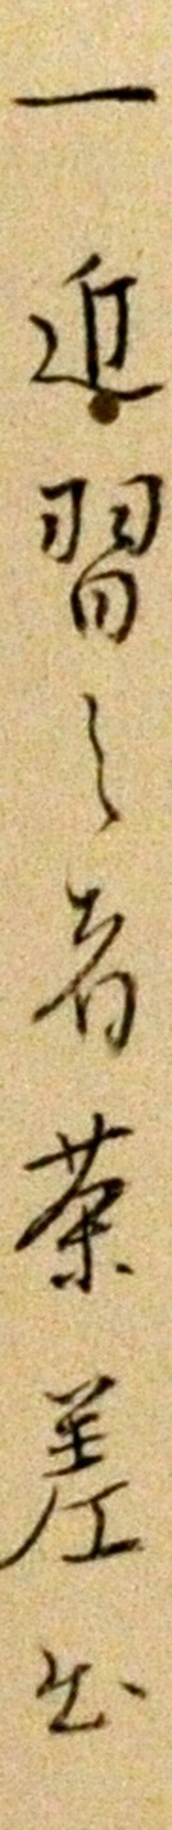一近習之者茶差出
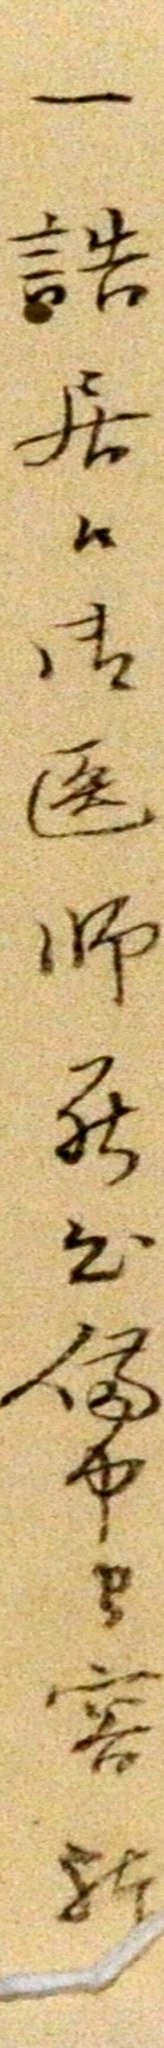一詰折居候御医師罷出備中守容躰
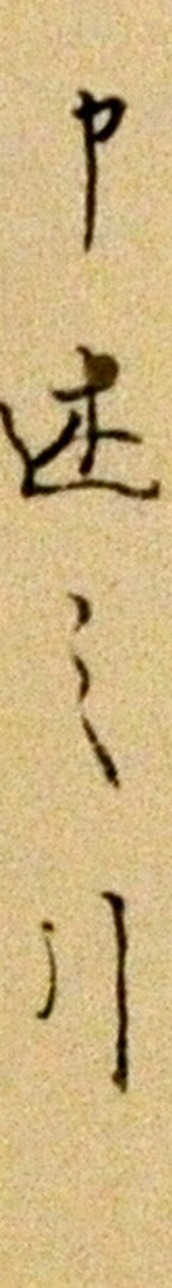申述之引
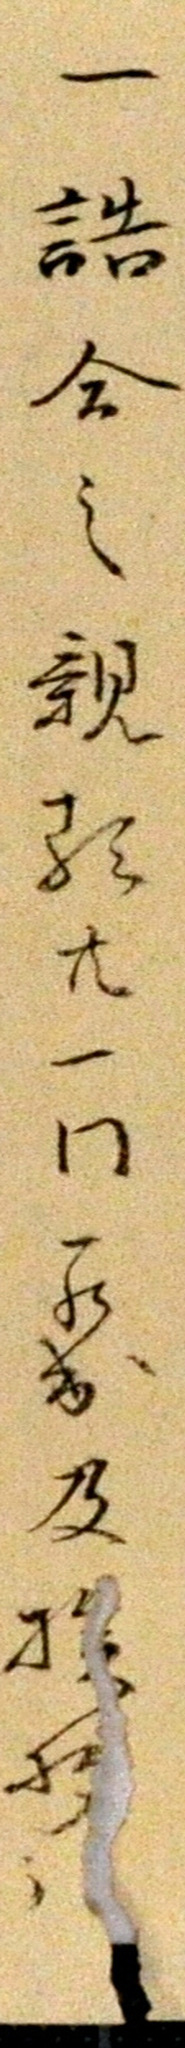一詰合之親類共一同罷出及挨拶引
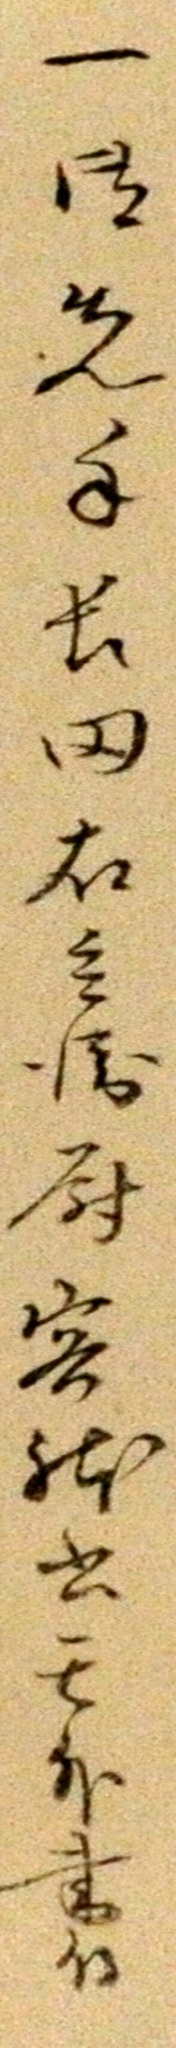一御先手長田右兵衛尉容躰書其外書付
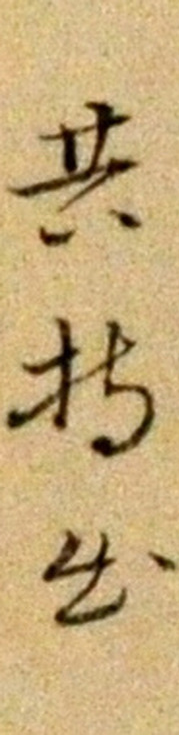共持出
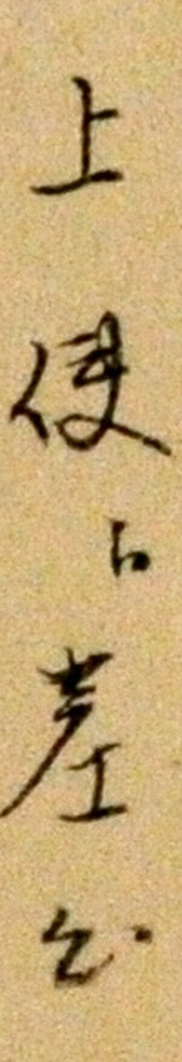上使え差出
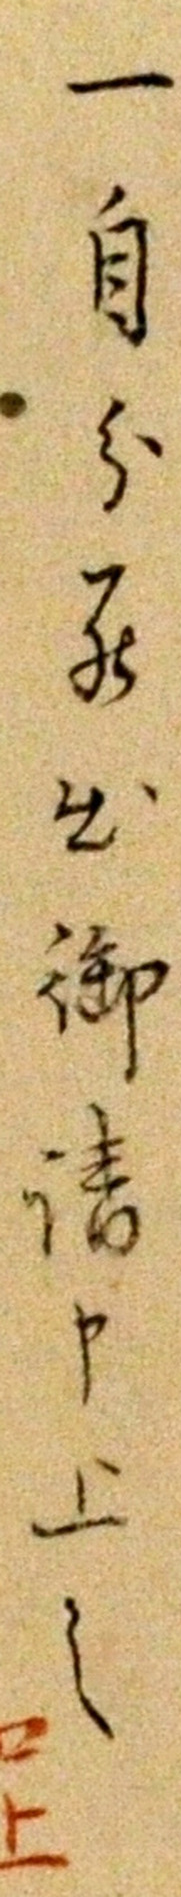一自分罷出御請申上之口上振之
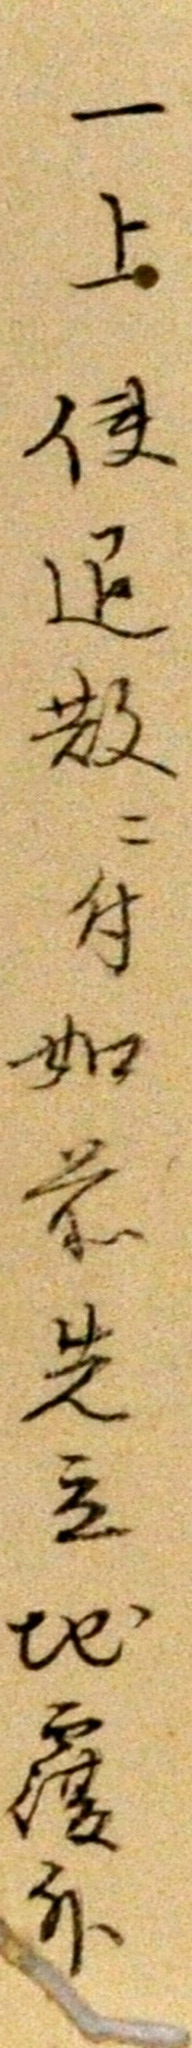一上使退散ニ付如前先立地覆外
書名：上使仰付ラレ候節ノ留外
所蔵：伊那市立高遠町図書館・合同会社AMANE
